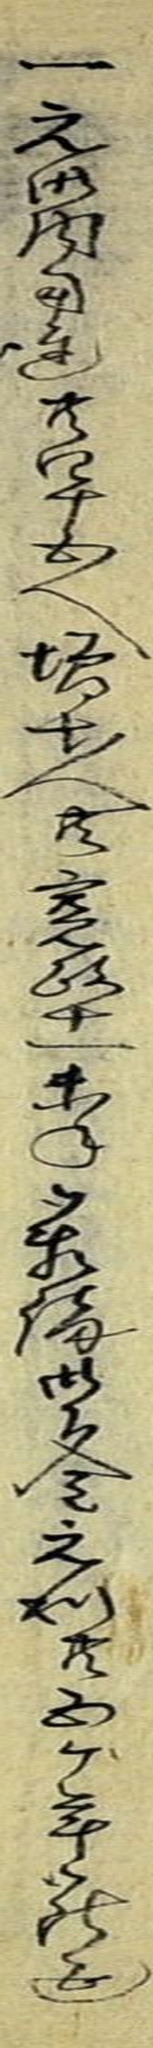一元御内用達共四十五人増十人共寛政十一未年御頼講御下金元利共五ヶ年御断延
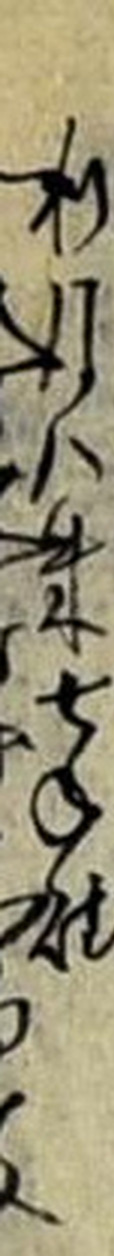利月八朱七年賦
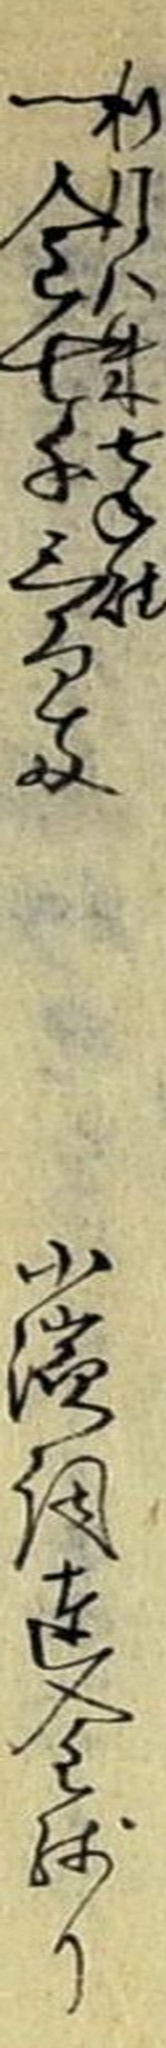一金七千三百両小浜調達金残り
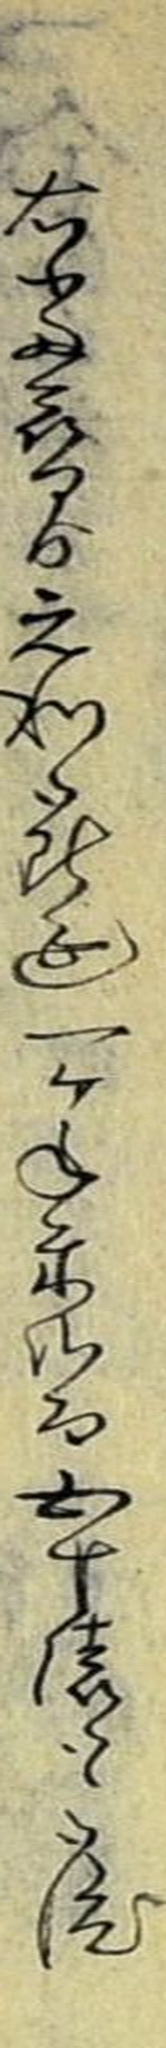右当暮ゟ元利御断延一ヶ年米弐百五十俵つヽ御渡
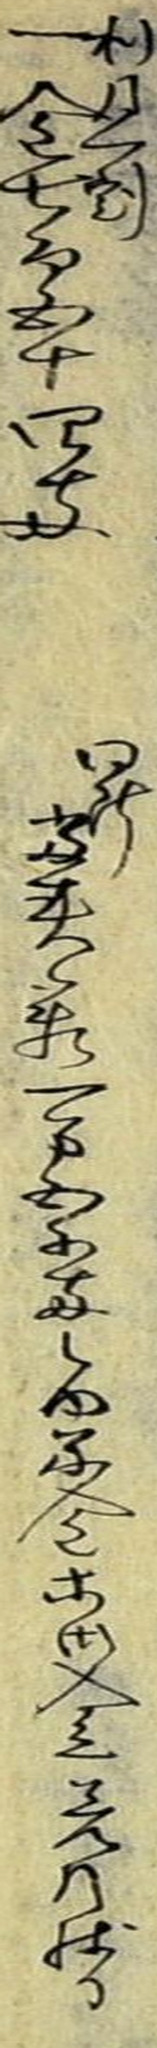一金七百五十四両同断当春御頼一万五千両之内米金等御金差引残り
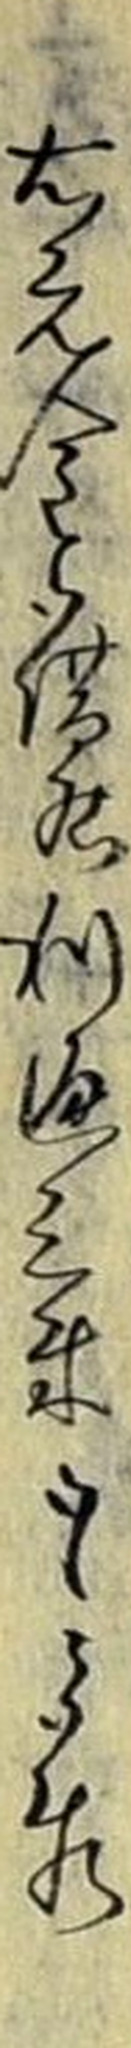右元金御借居利通三朱つヽに御頼
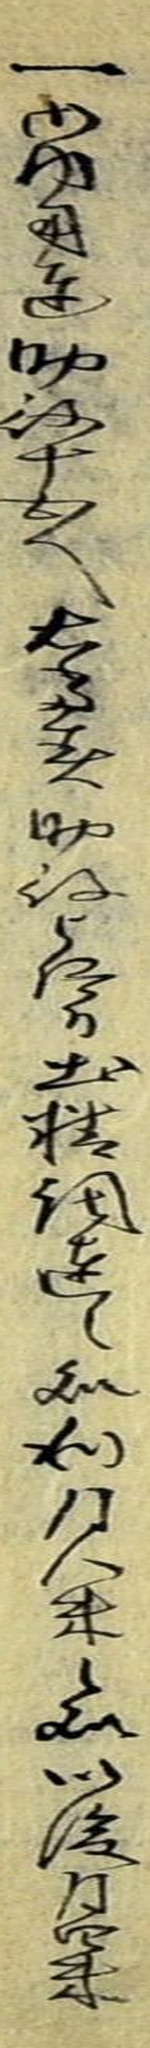一御内用達助役十五人右当春助役被仰付出精調達候処利月八朱之処以後月四朱
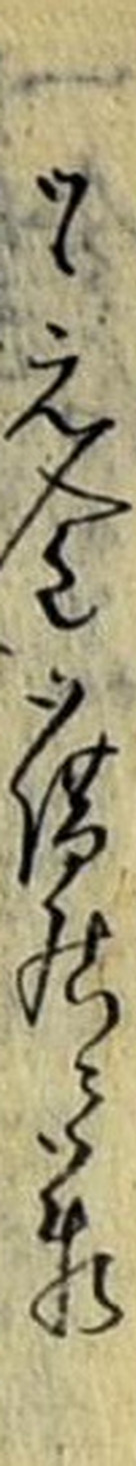つヽ元金御借居に御頼
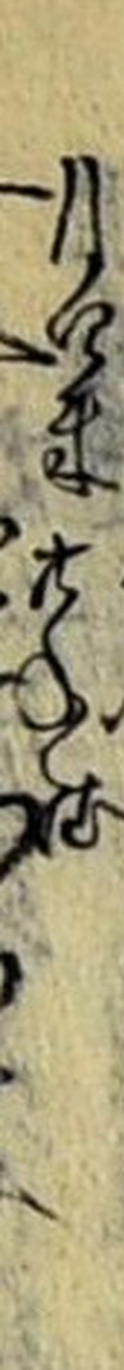月四朱廿年賦
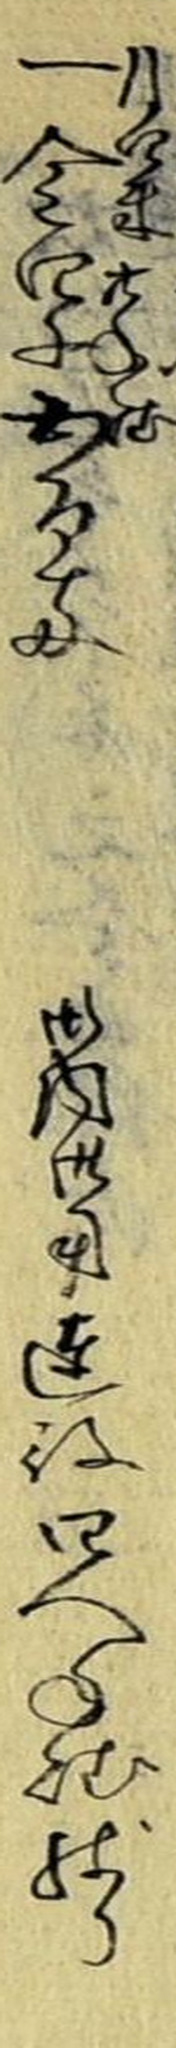一金四千五百両御内御用達役四人年賦残り

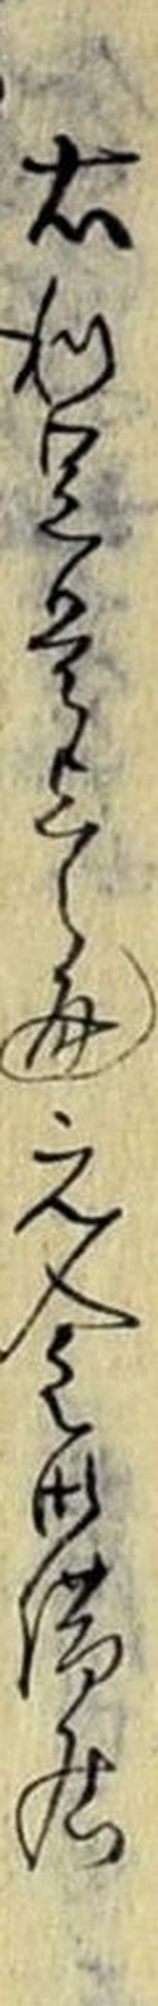右利足是迄之通元金御借居
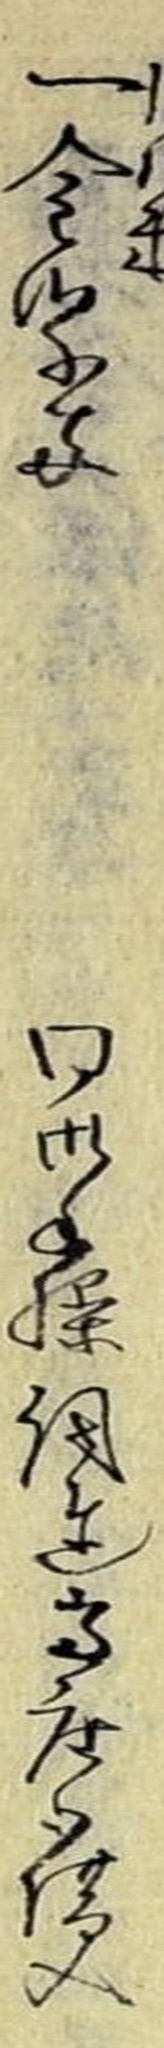一金弐千両同御手繰調達当座御借入
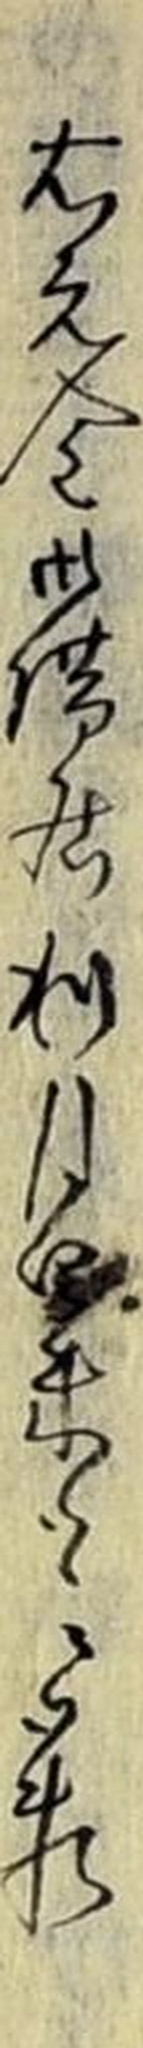右元金御借居利月四朱つヽに御頼
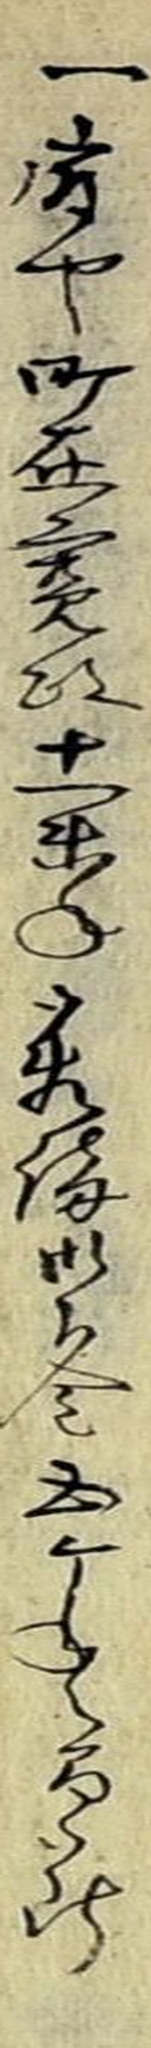一府中町在寛政十一未年御頼講御下金五ヶ年之間御断
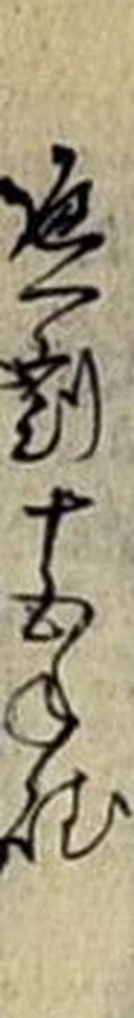通一割十五年賦
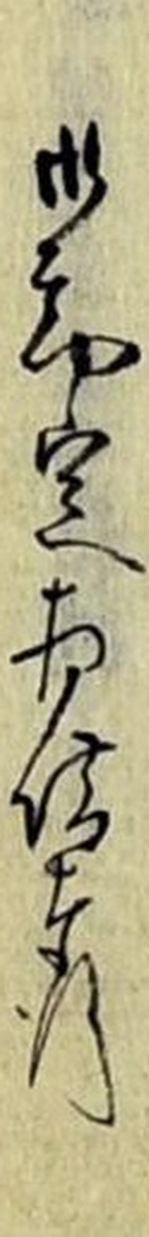御勘定拝借奉行
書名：命令之部 四
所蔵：福井県文書館 Fukui Prefectural Archives
